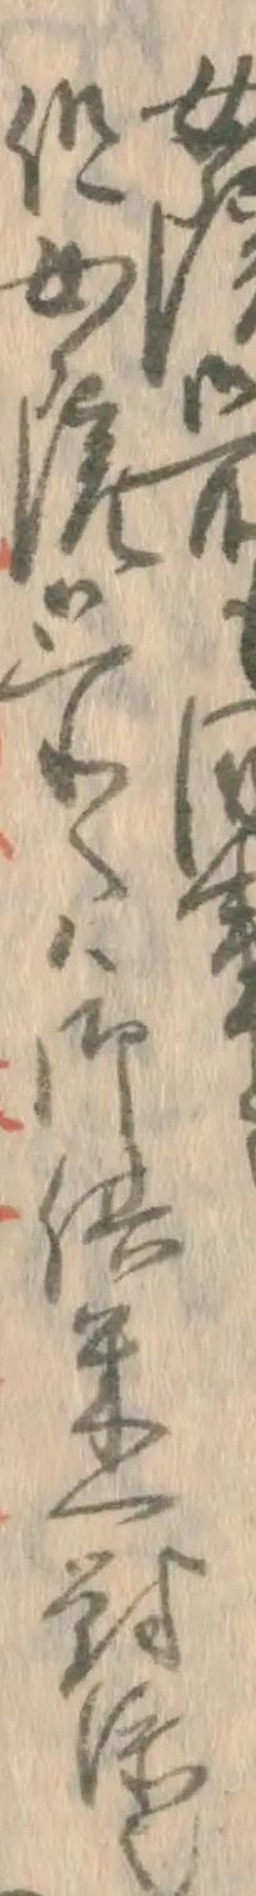但女院御所へハ御供米一対添也
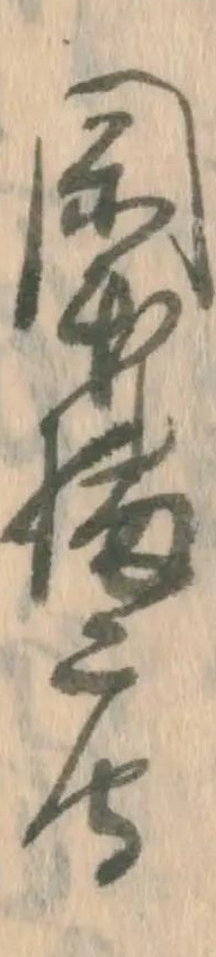岡本播磨守
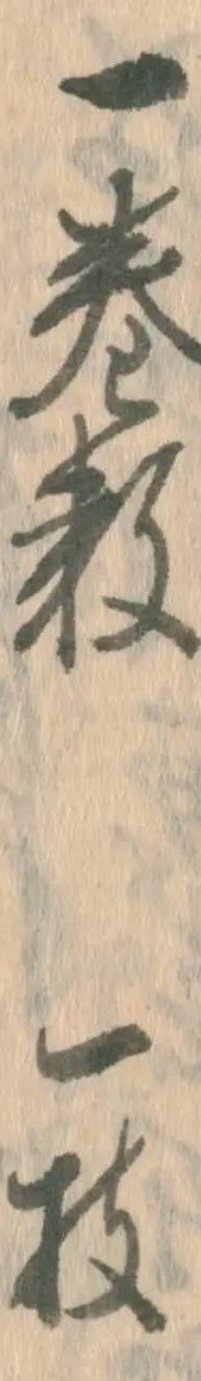一巻数一枝
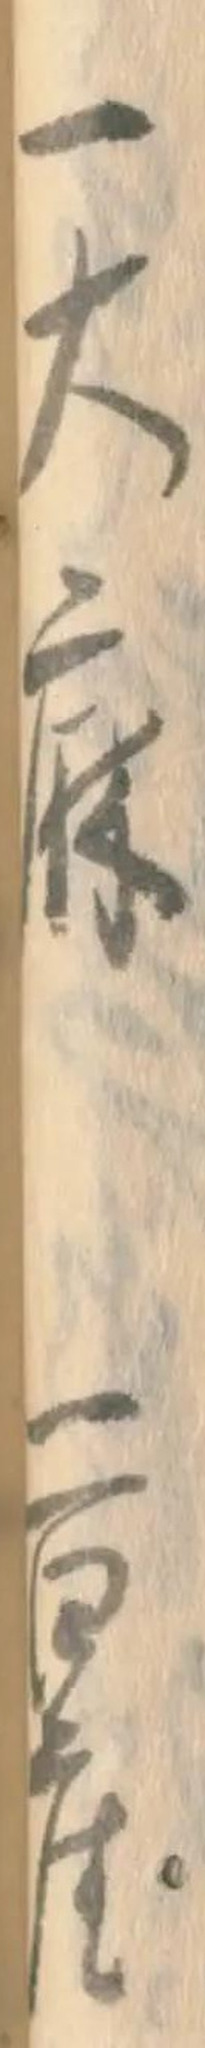一大麻一百座
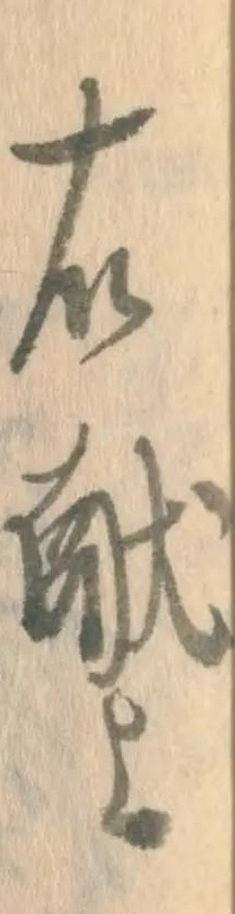右献上
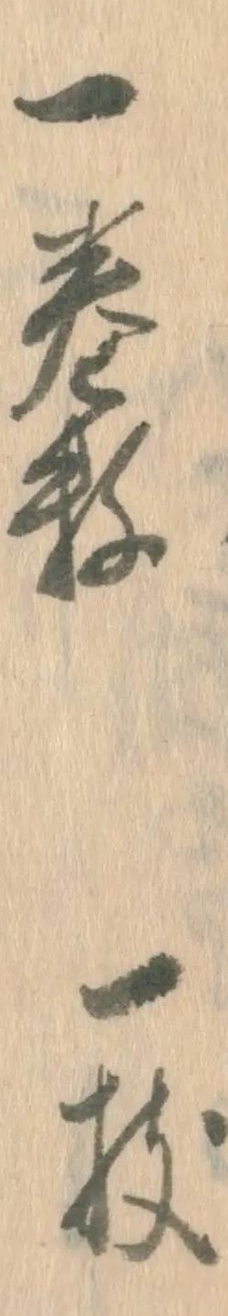一巻数一枝
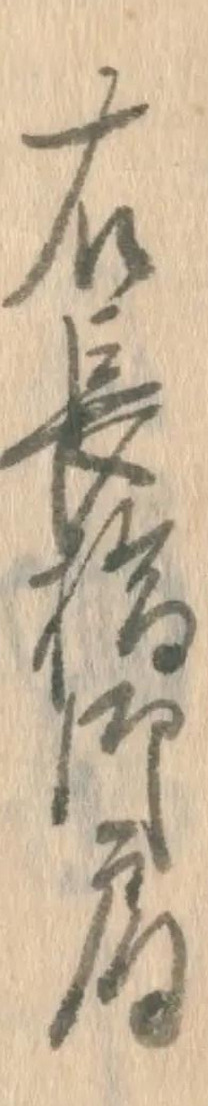右長橋御局
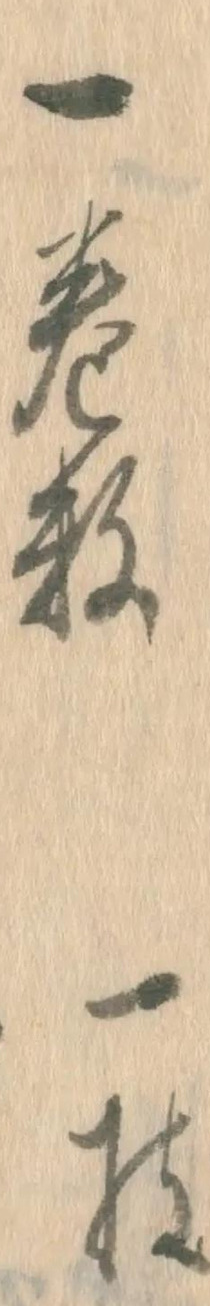一巻数一枝
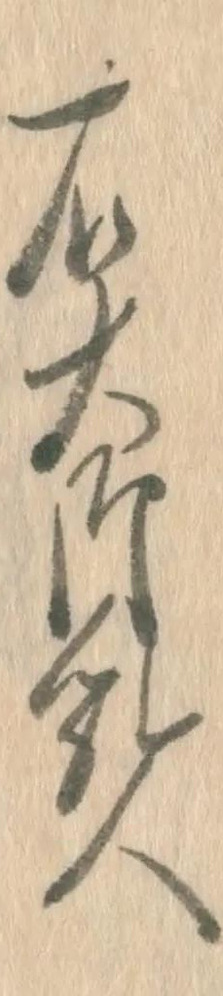右大御乳人
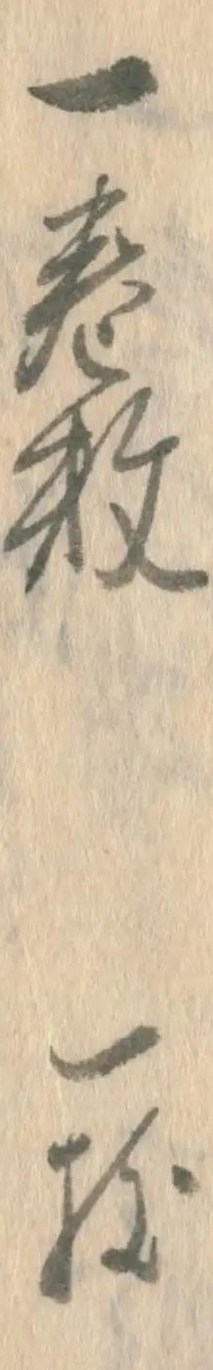一巻数一枝
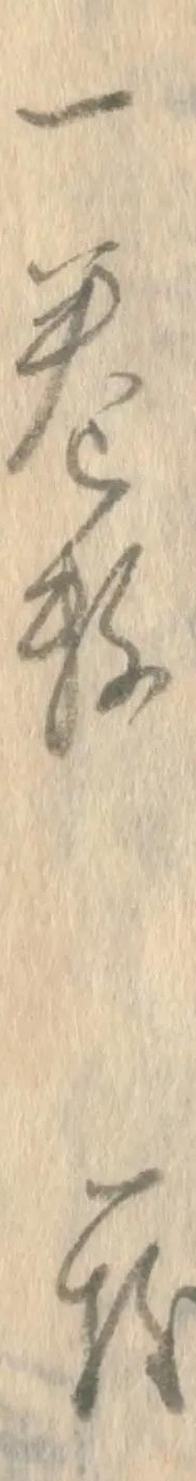一巻数一枝
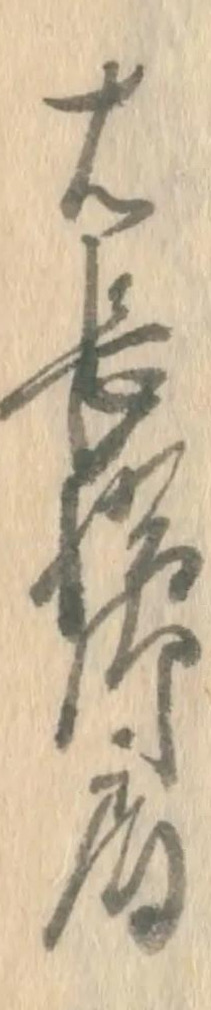右長橋御局

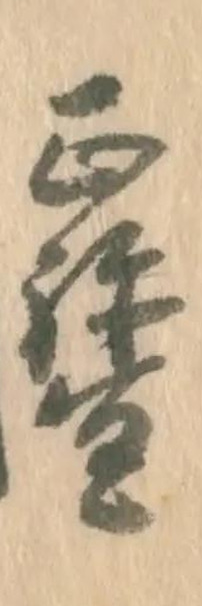正弥宜
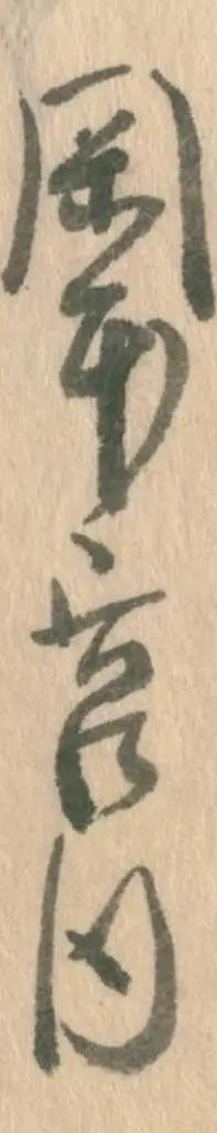岡本宮内
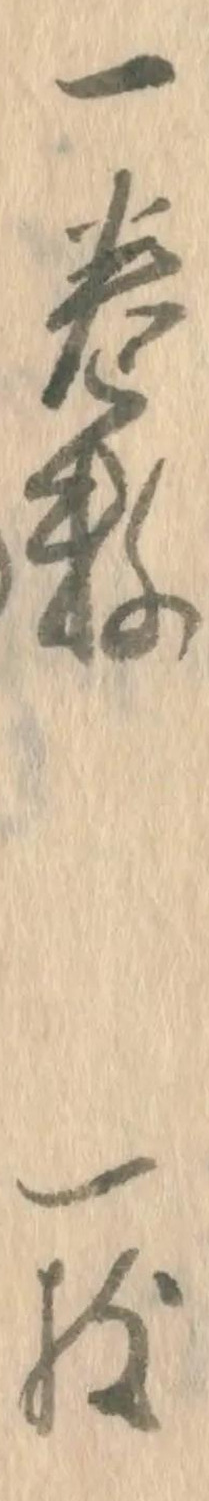一巻数一枝
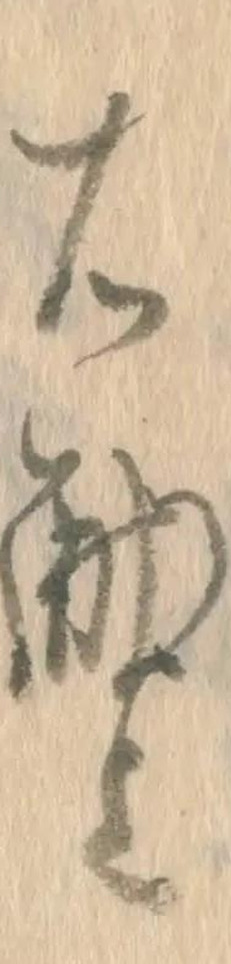右献上
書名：賀茂社記録. 第60冊
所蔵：国立国会図書館 National Diet Library, JAPAN
